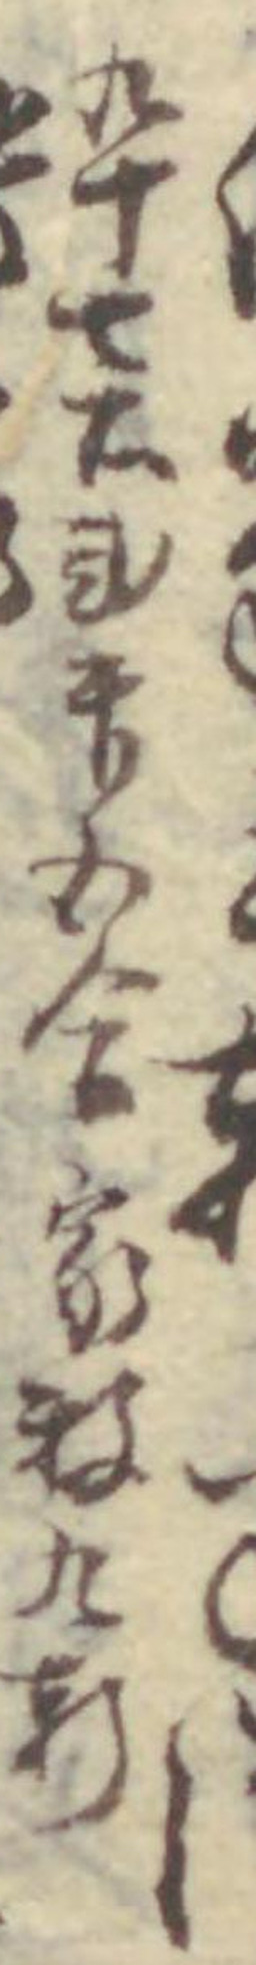高九十七石弐升五合家数九軒
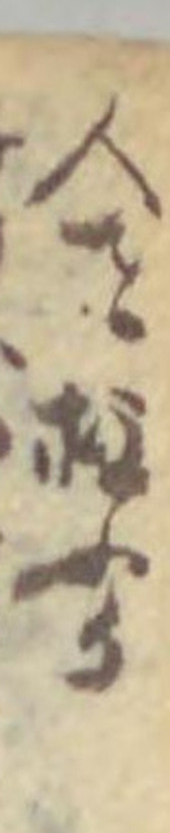人を救ふか
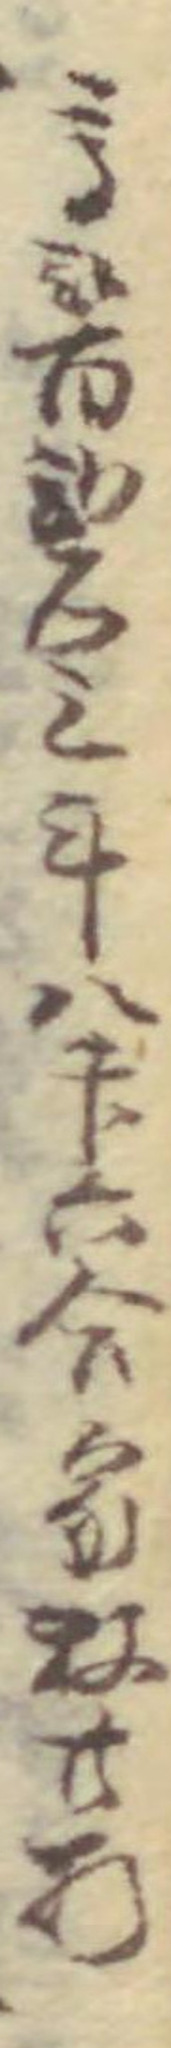高弐百弐石三斗八升六合家数廿軒
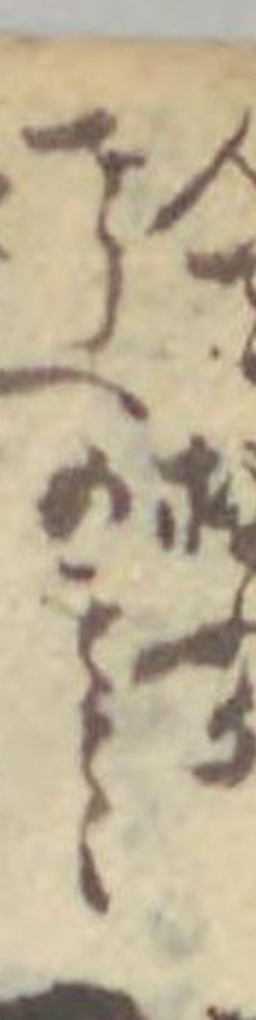をしへのもとゝ
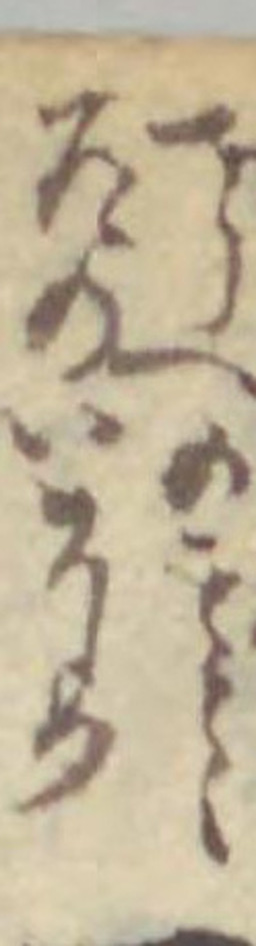道のいましめ
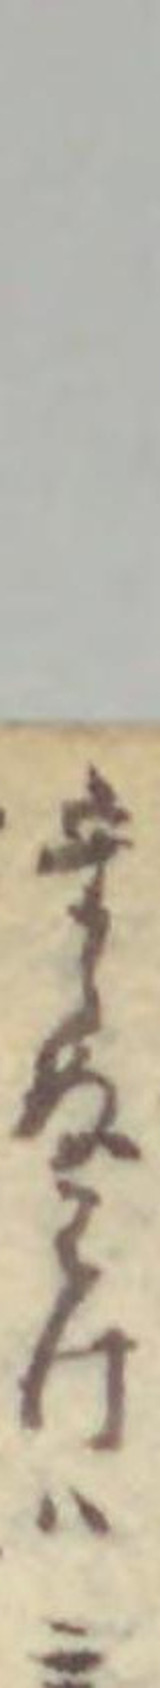守らぬわけハ
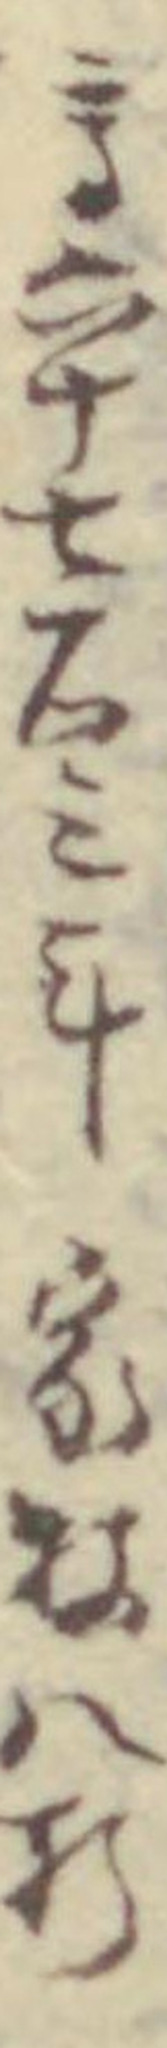高六十七石三斗家数八軒
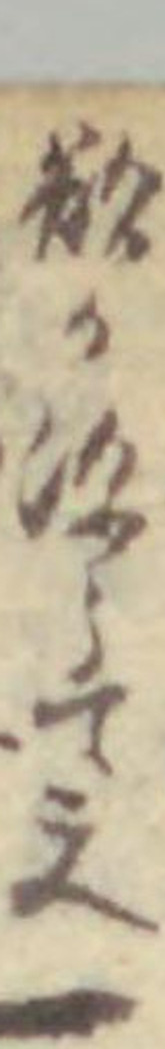欲か深うて文
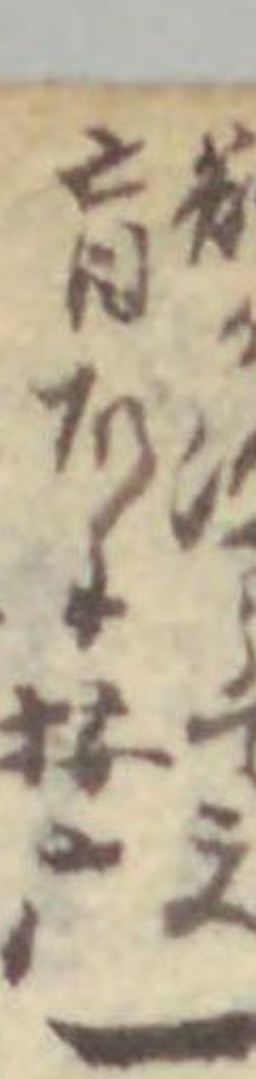盲故に按摩
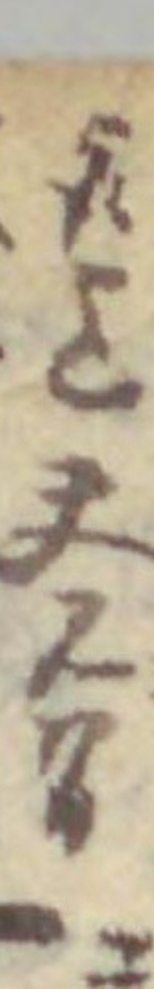取迄夫見習
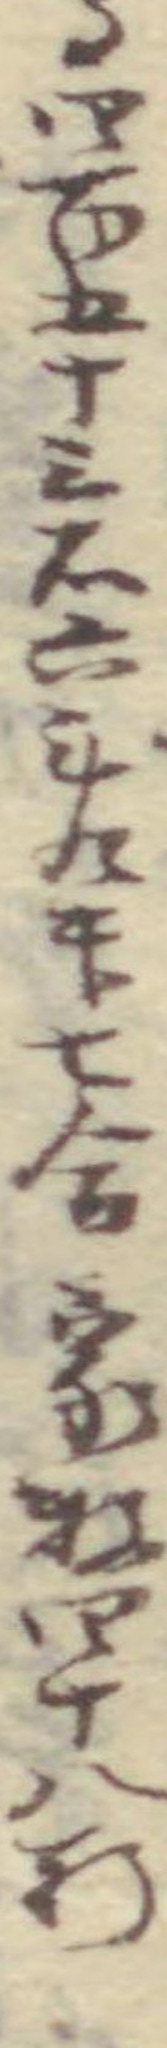高四百五十三石六斗九升七合家数四十八軒
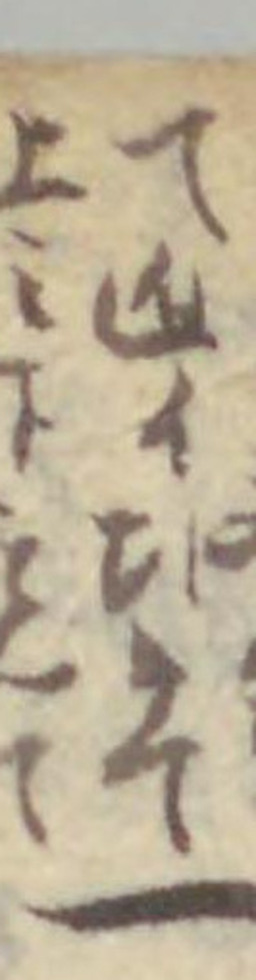上ミ下もんて
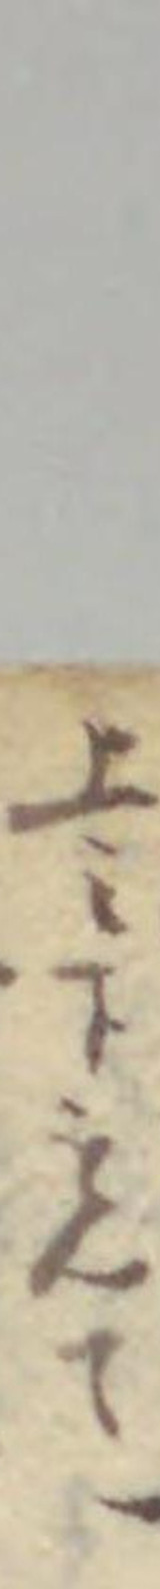上ミ下もんて
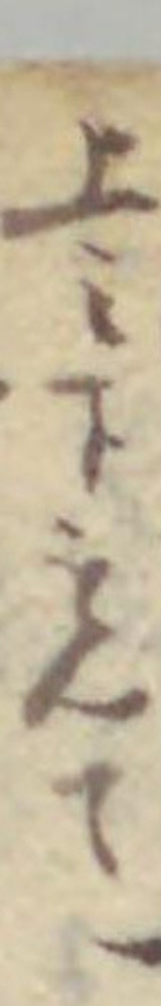上ミ下もんて
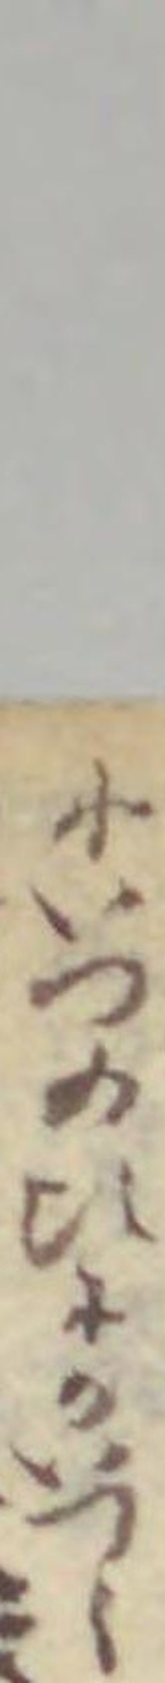にいつの頃にかいつく
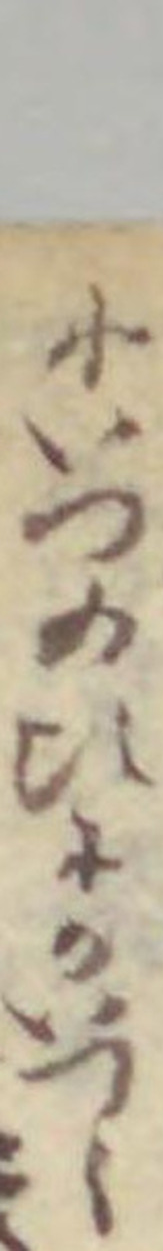にいつの頃にかいつく
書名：鶯宿雑記. 巻199-200
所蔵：国立国会図書館 National Diet Library, JAPAN
